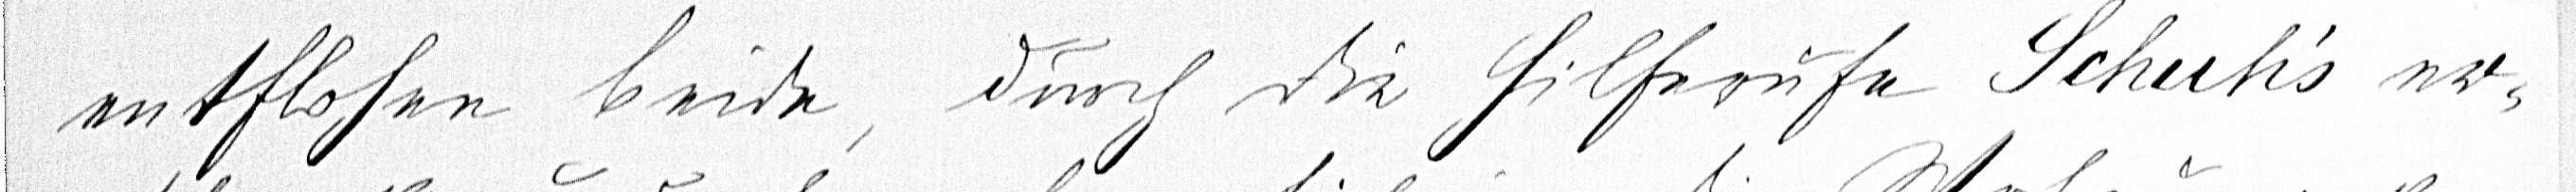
entflohen beide, durch die Hilferufe Schuh’s er¬
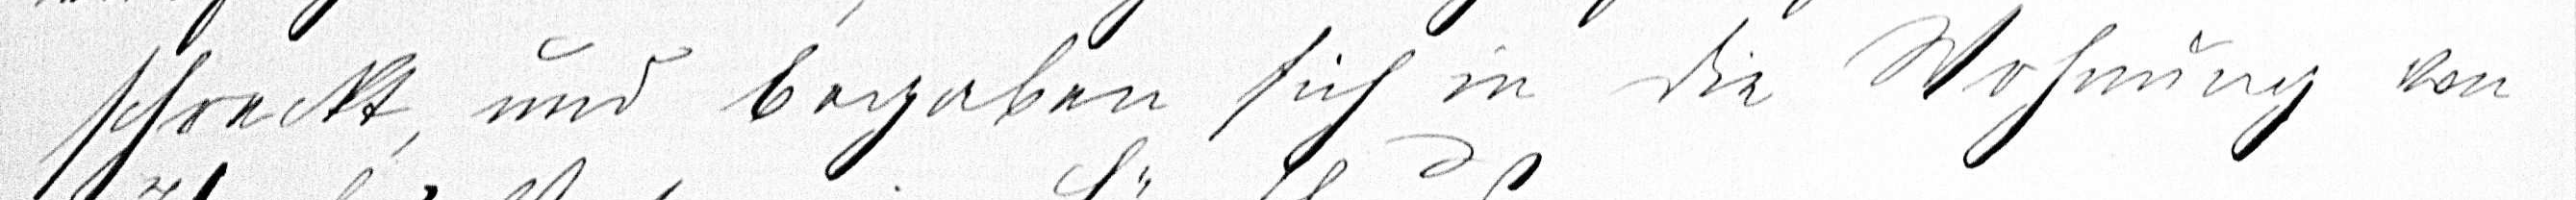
schreckt, und begaben sich in die Wohnung von
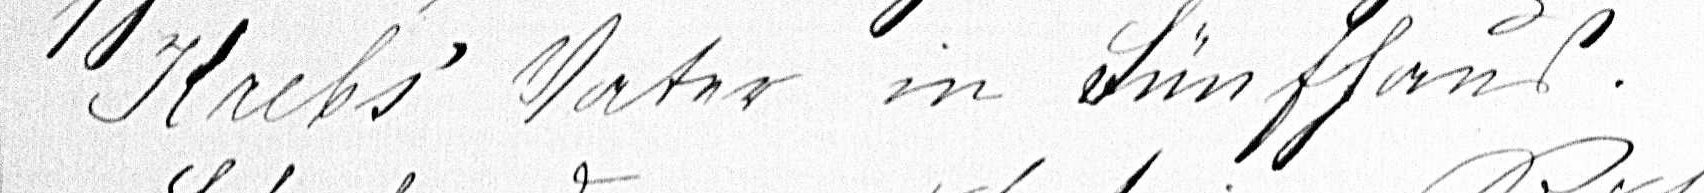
Krebs’ Vater in Fünfhaus.
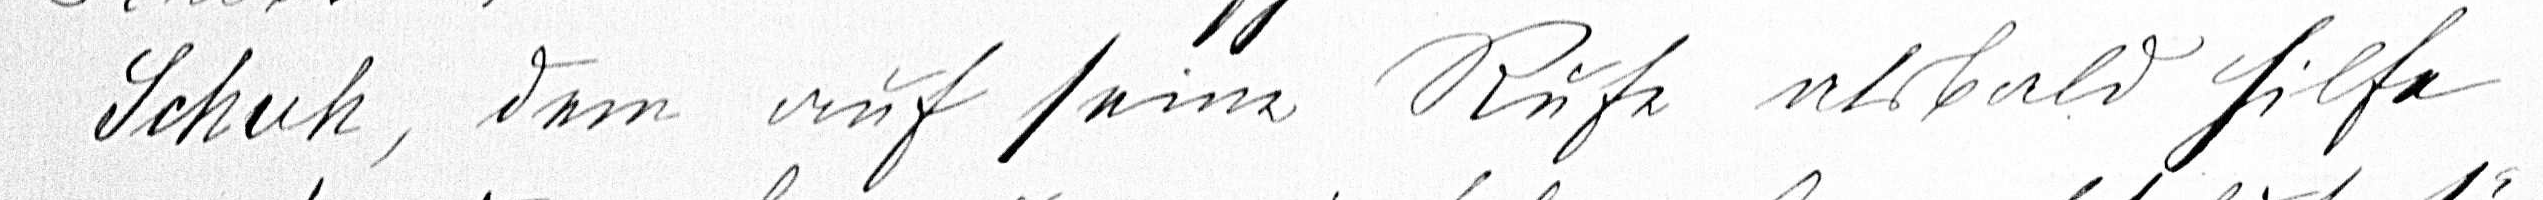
Schuh, dem auf seine Rufe alsbald Hilfe
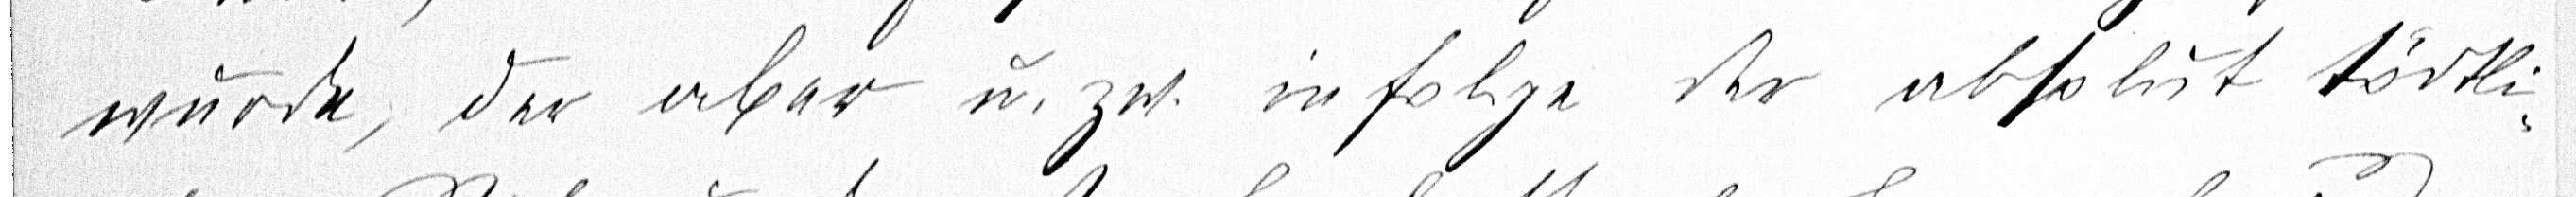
wurde, der aber u. zw. in folge der absolut tödli¬
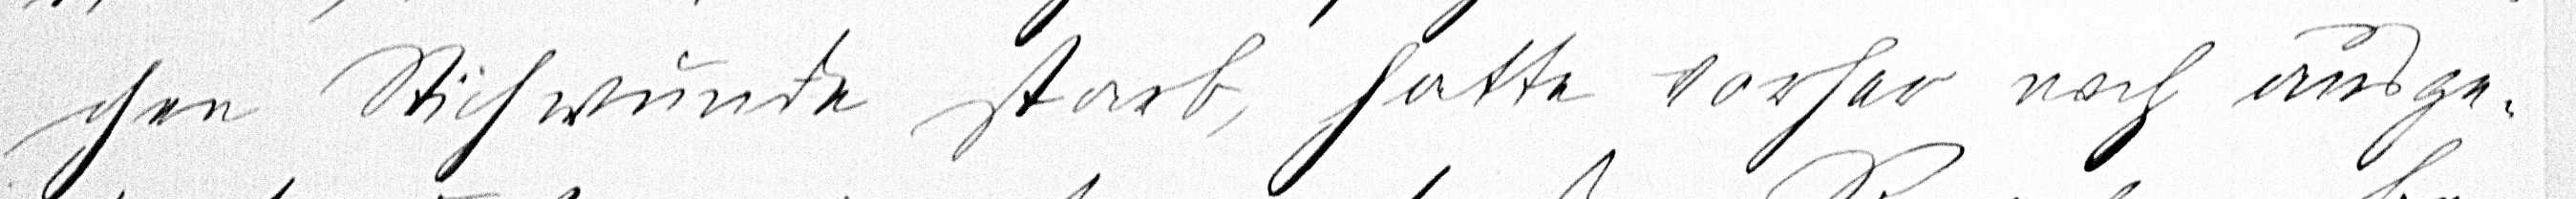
chen Stichwunde starb, hatte vorher noch ausge¬
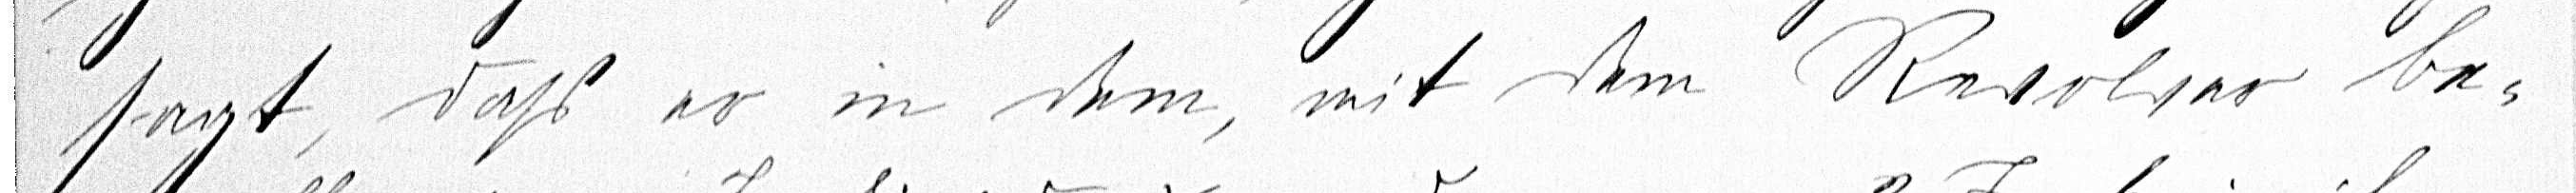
sagt, daß er in dem mit dem Revolver be¬
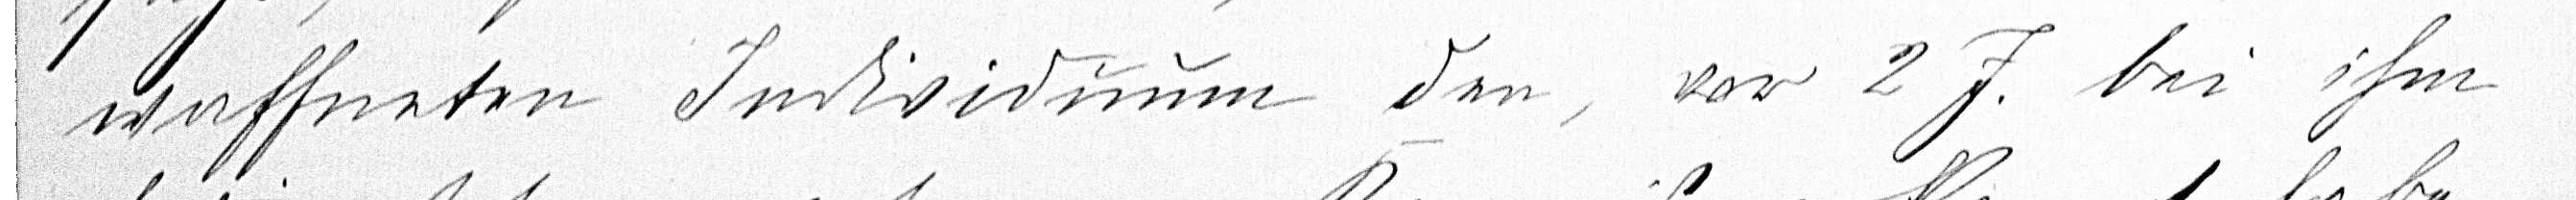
waffneten Individuum der, vor 2 J. bei ihm
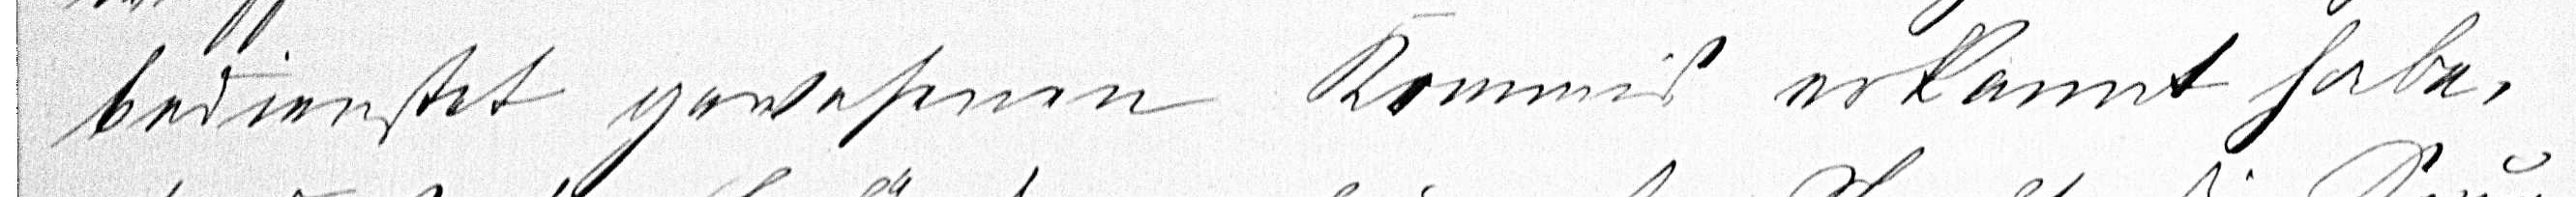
bedienstet gewesenen Kommis erkannt habe,
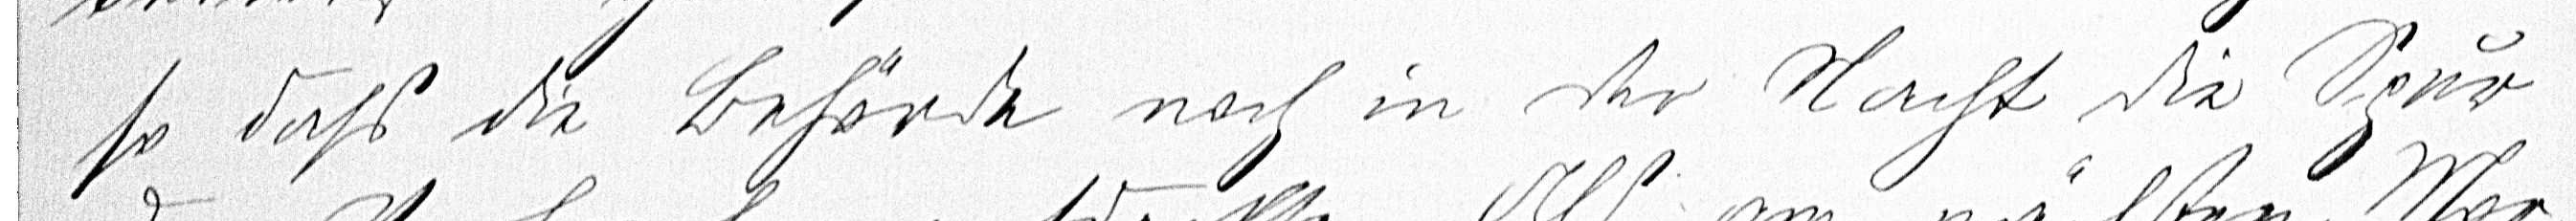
so daß die Behörde noch in der Nacht die Spur
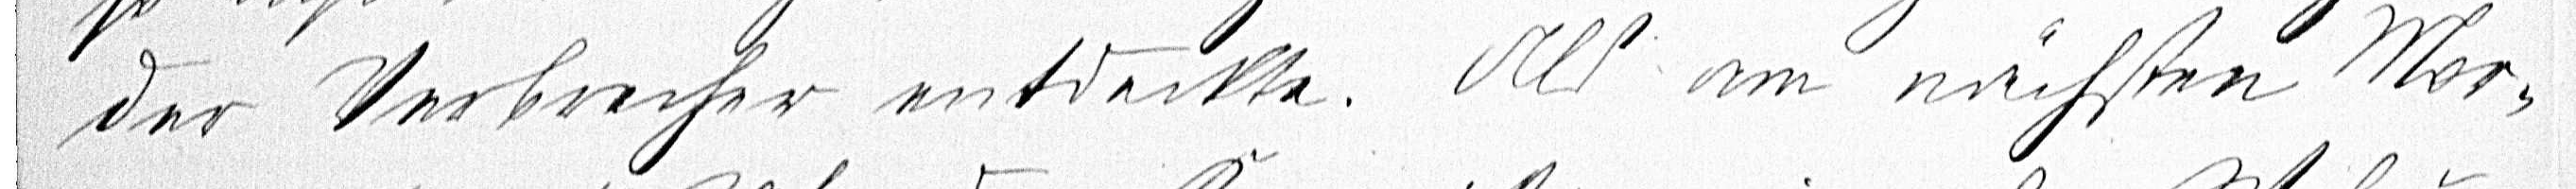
der Verbrecher entdeckte. Als am nächsten Mor¬
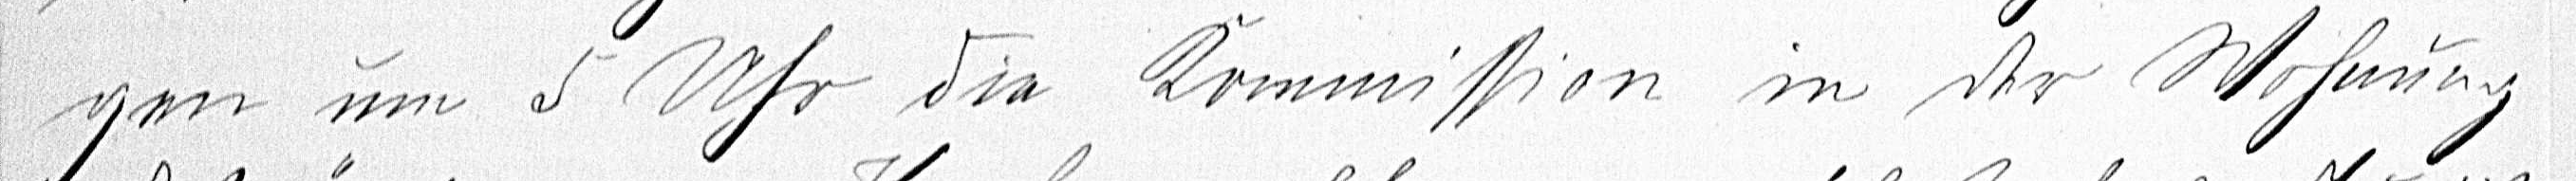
gen um 5 Uhr die Kommission in der Wohnung
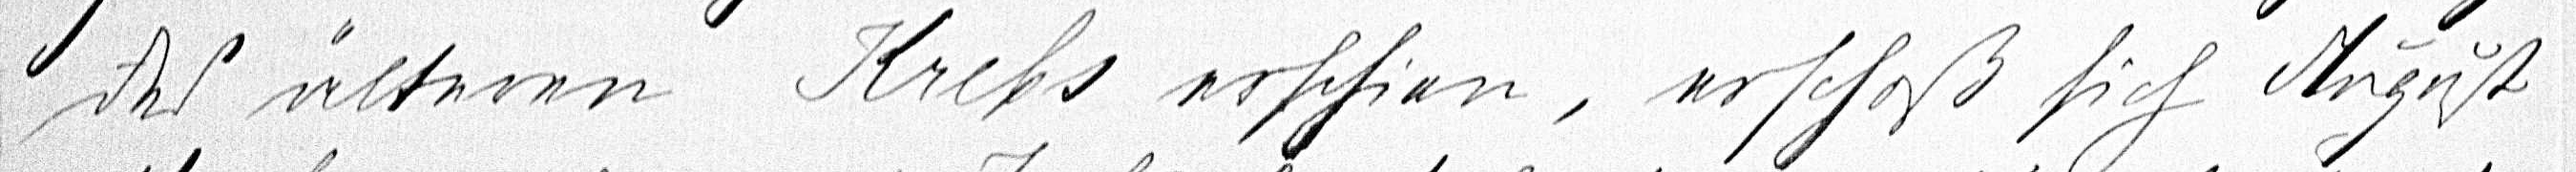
des älteren Krebs erschien, erschoß sich August
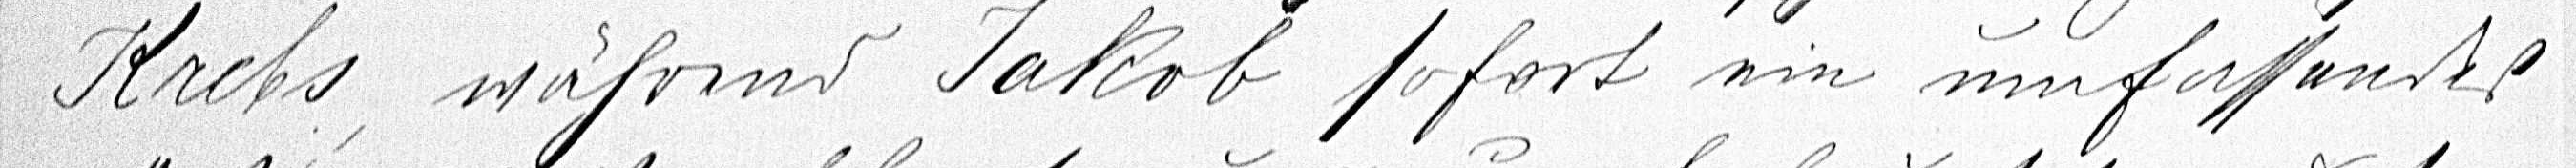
Krebs während Jakob sofort ein umfallendes
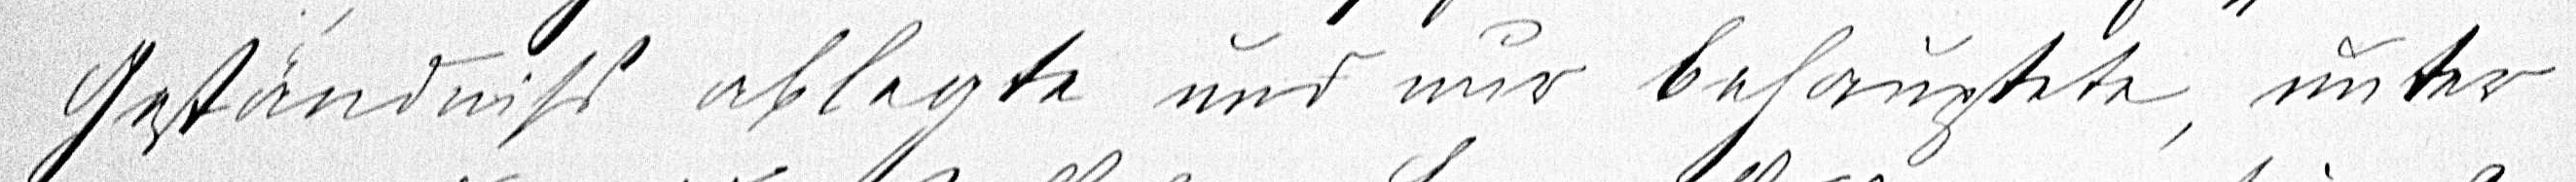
Geständniß ablegte und nur behauptete, unter
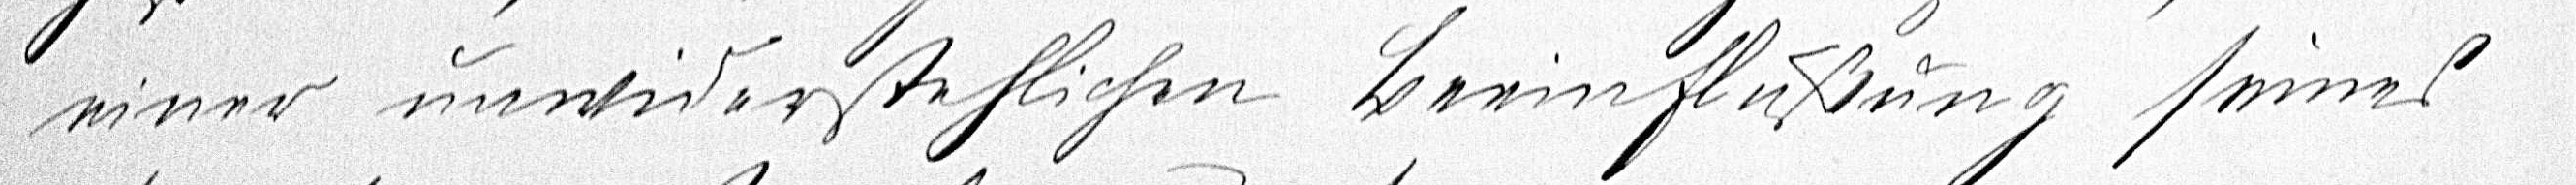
einer unwiderstehlichen Beeinflußung seines
